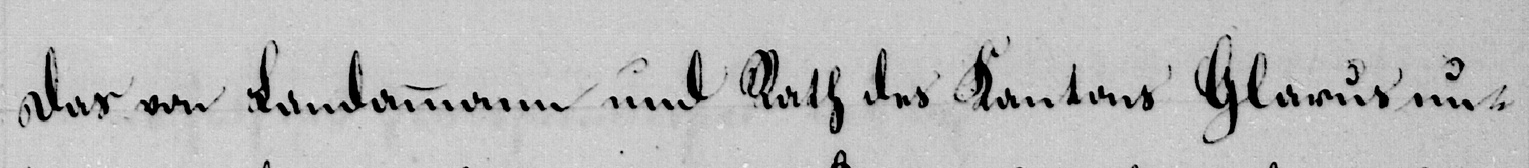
Das von Landammann und Rath des Kantons Glarus un¬
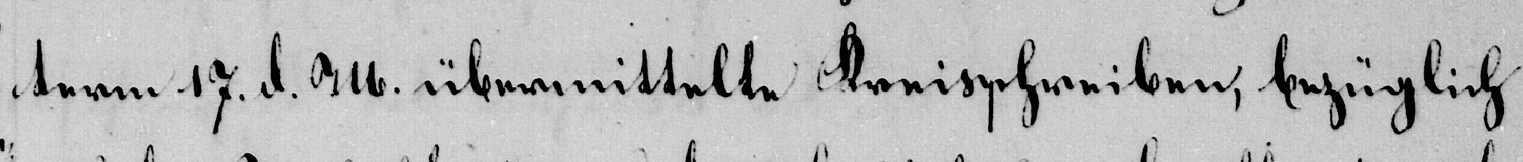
term 17. d. M. übermittelte Kreisschreiben, bezüglich
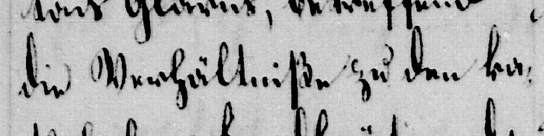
die Verhältniße zu den ka¬
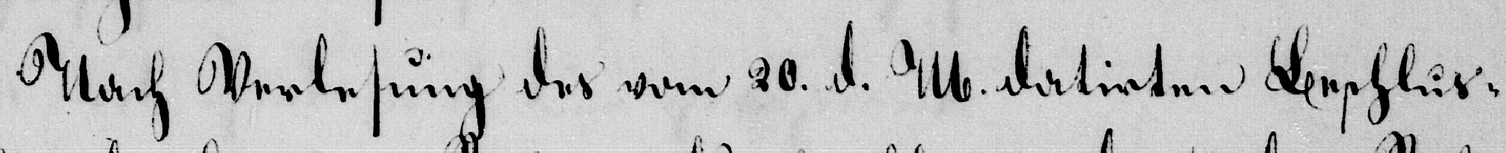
Nach Verlesung des vom 20. d. M. datirten Beschluß¬
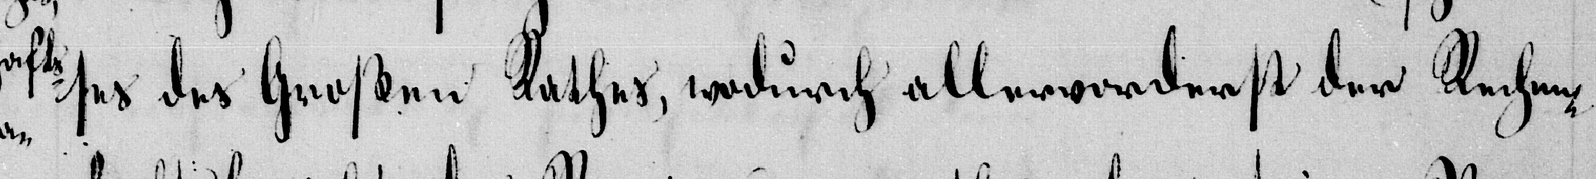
es des Großen Rathes, wodurch allervorderst der Rechen¬
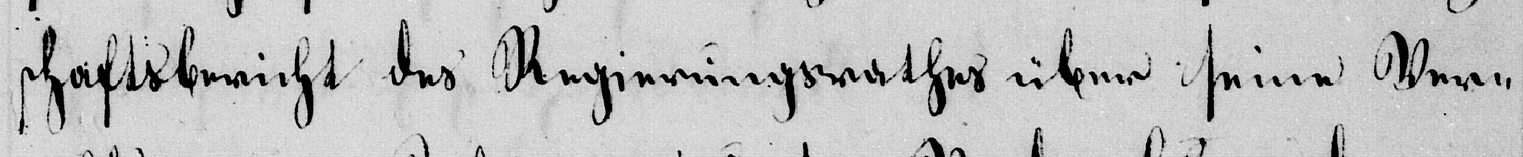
schaftsbericht des Regierungsrathes über seine Ver¬
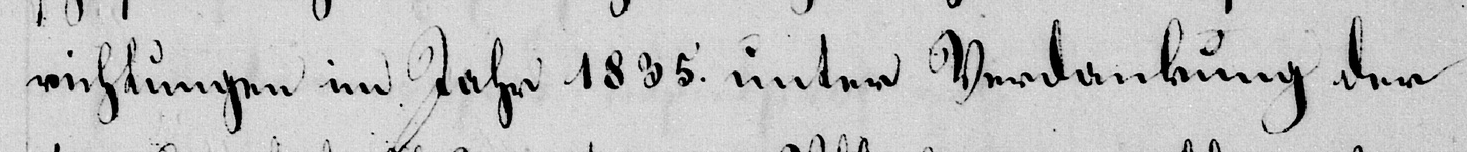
richtungen im Jahr 1835. unter Verdankung der
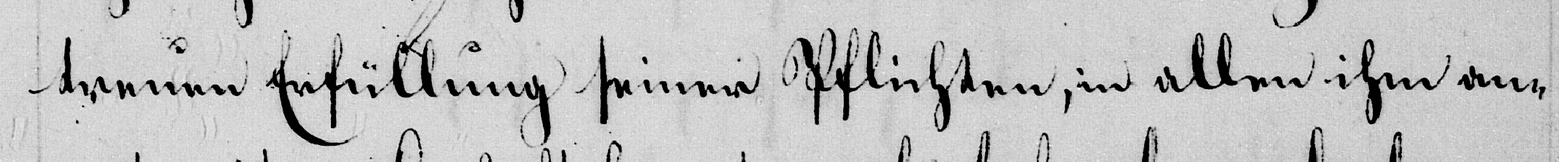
treuen Erfüllung seiner Pflichten, in allen ihm an¬
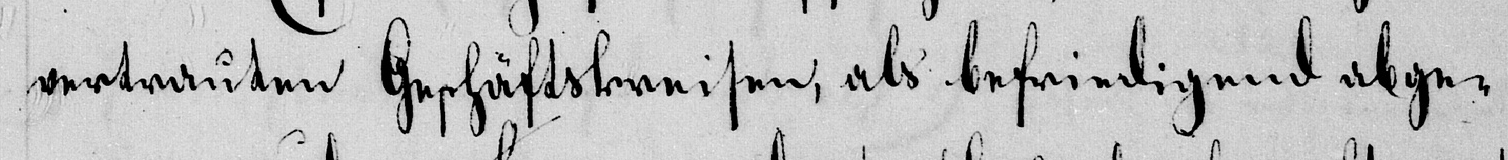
vertrauten Geschäftskreisen, als befriedigend abge¬
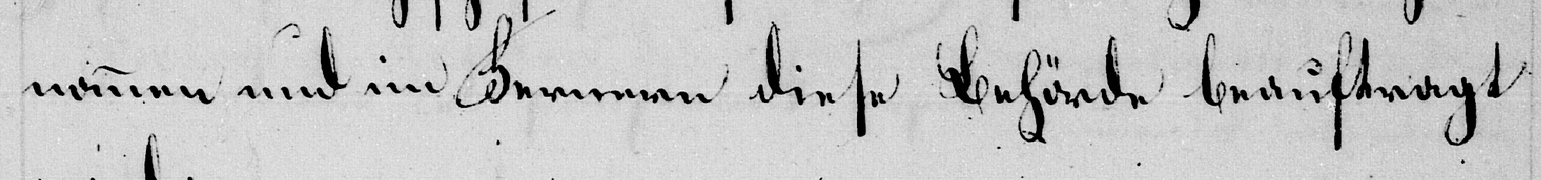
nommen und im Fernern diese Behörde beauftragt
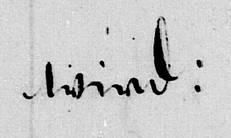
wird:
